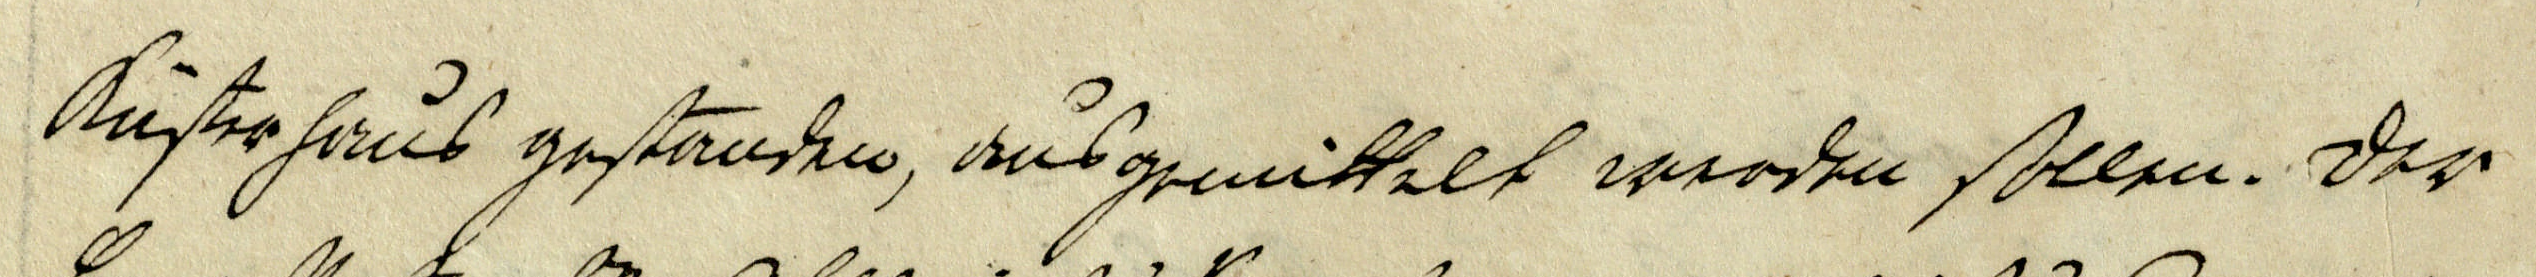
Küsterhaus gestanden, ausgemittelt werden sollen. Der
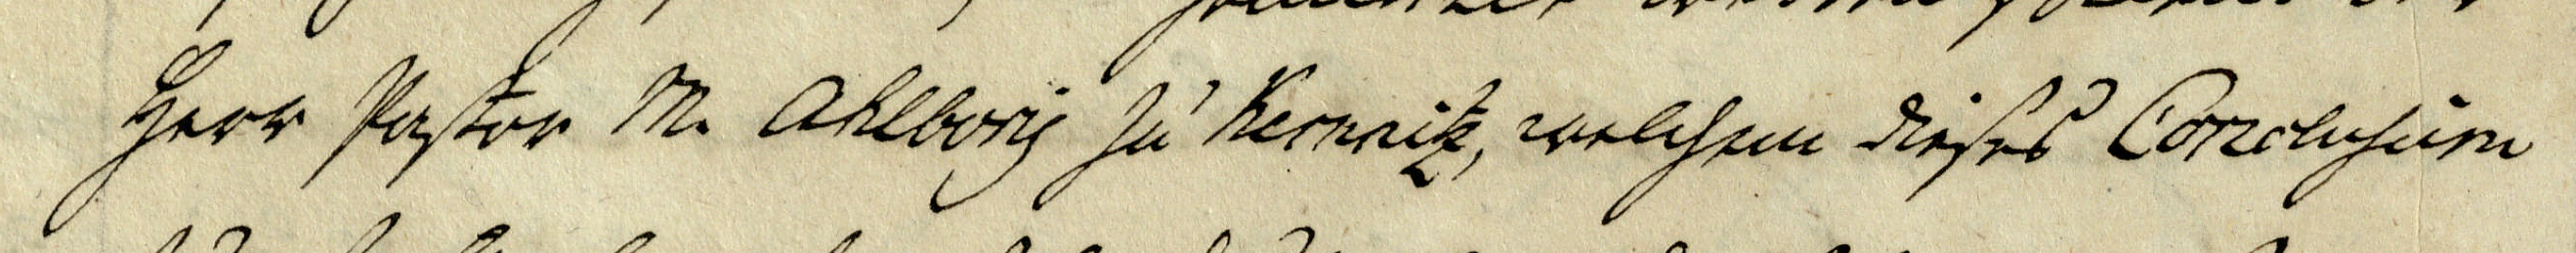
Herr Pastor M. Ahlborÿ zu Kemnitz, welchem dieses Conclusum
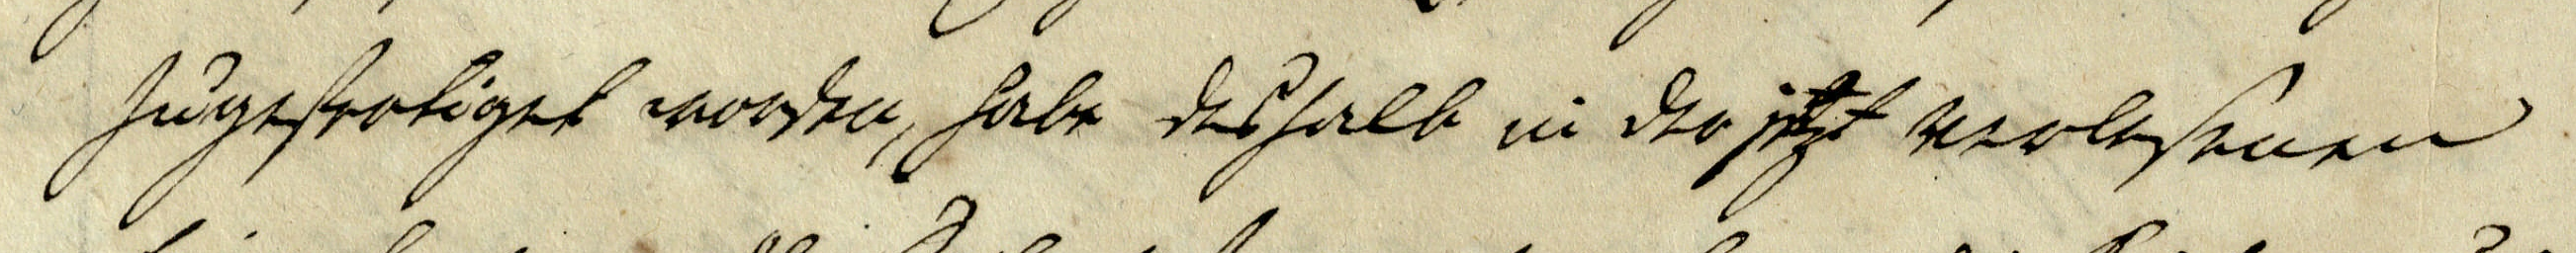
zugefertiget worden, habe deshalb in der jetzt verlesenen
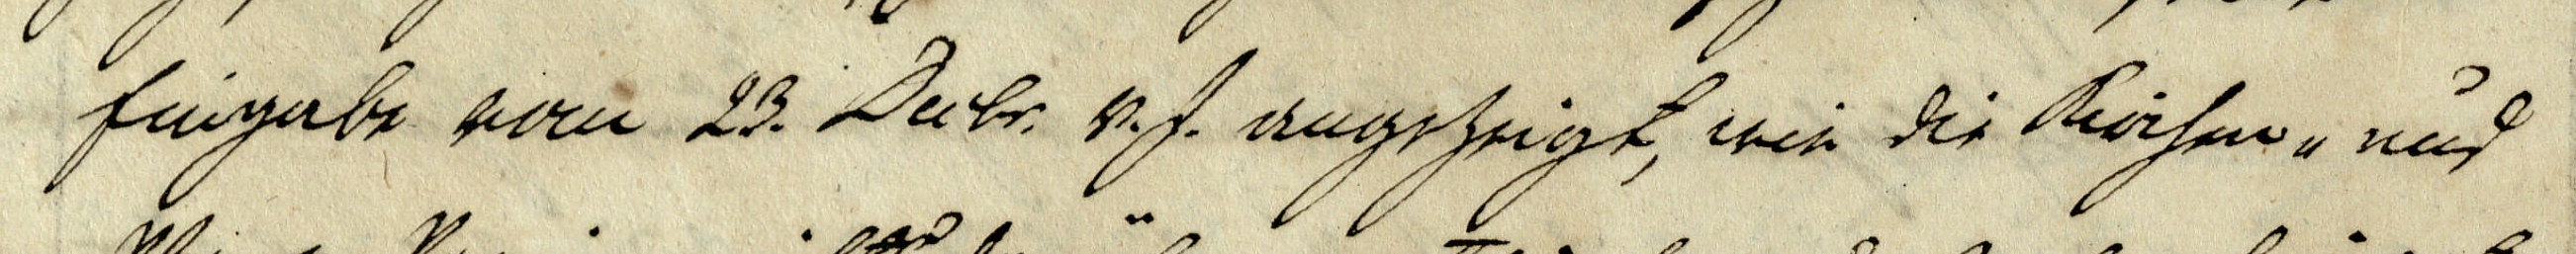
Eingabe vom 23. Decbr. v. J. angezeigt, wie die Kirchen- und
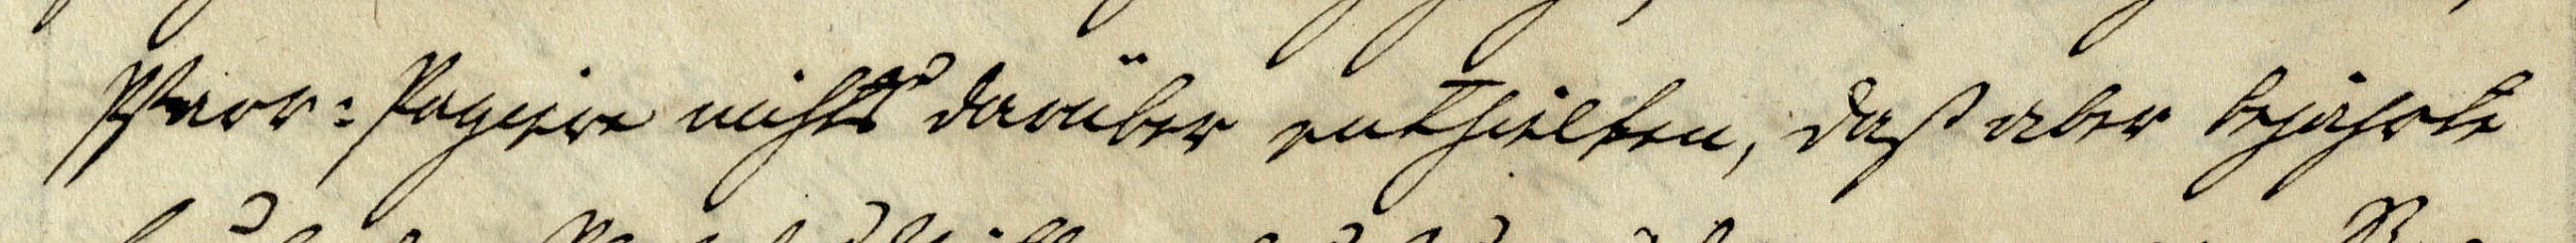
Pfarr-Papiere nichts darüber enthielten, daß aber bejahrte
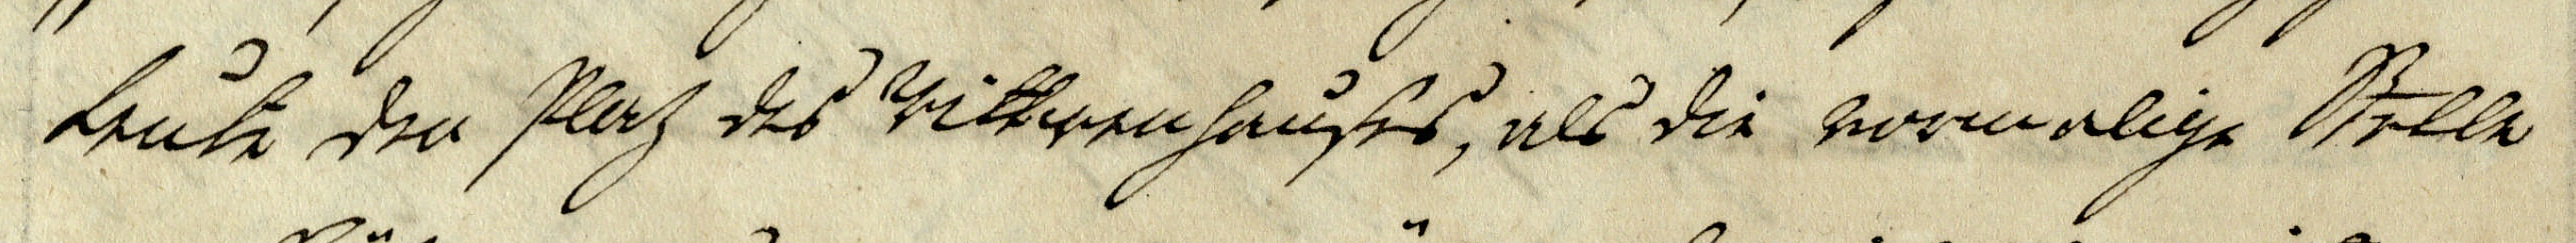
Leute den Plaz des Wittwenhauses, als die vormalige Stelle
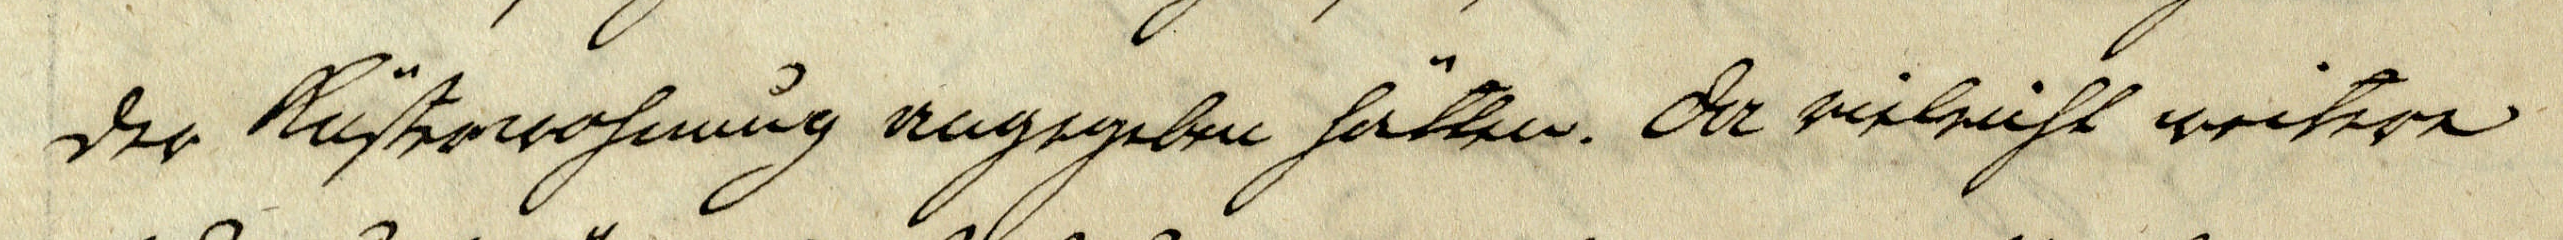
der Küsterwohnung angegeben hätten. Da vieleicht weitere
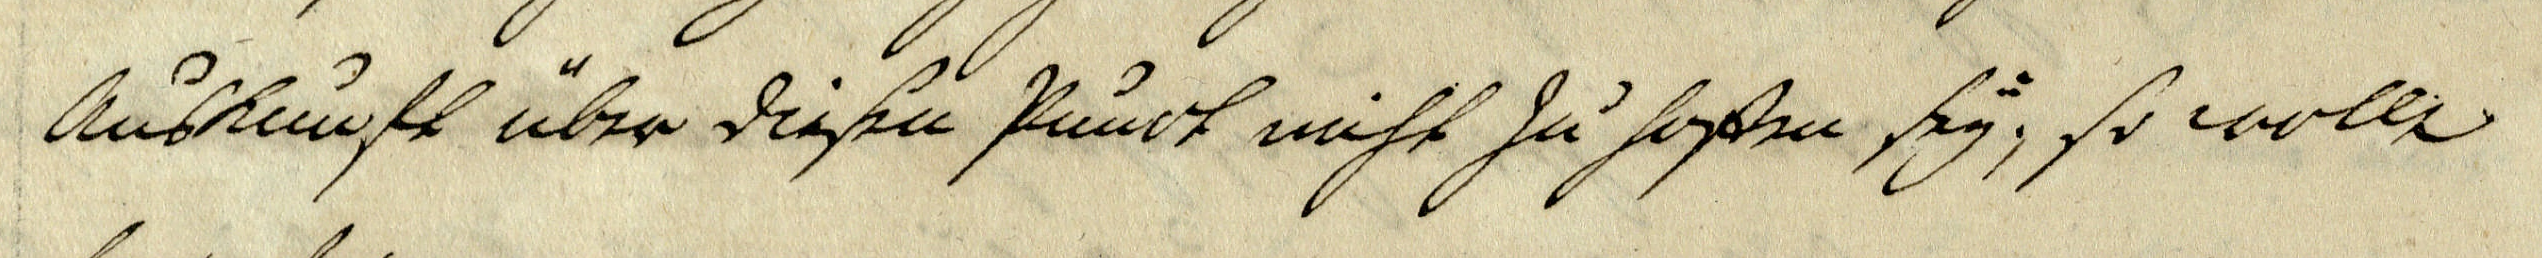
Auskunft über diesen Punct nicht zu hoffen seÿ; so wolle
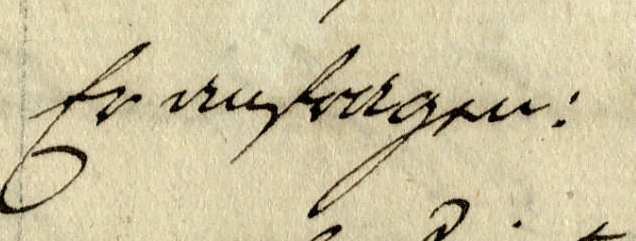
Er anfragen:
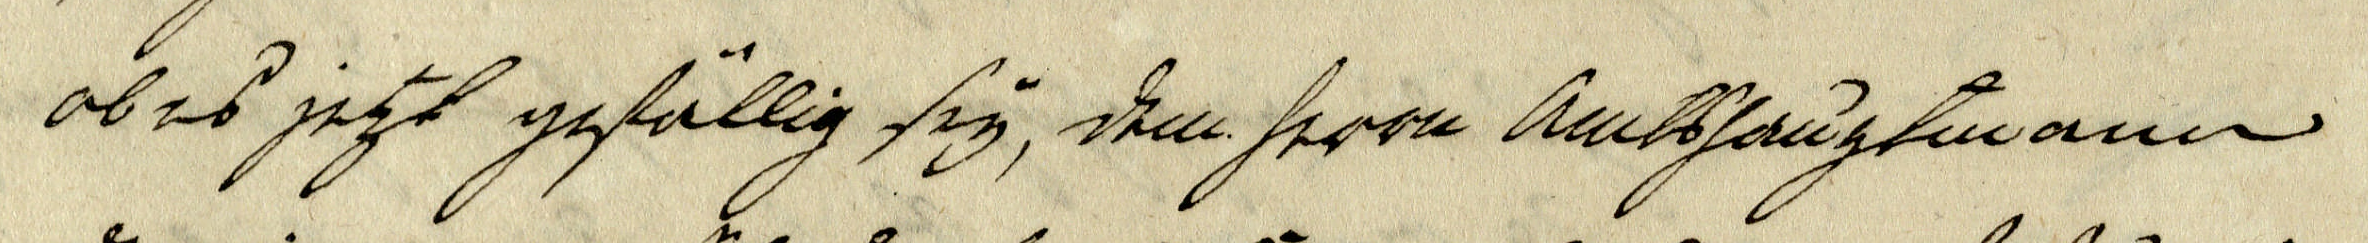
ob es jetzt gefällig seÿ, dem Herrn Amtshauptmann
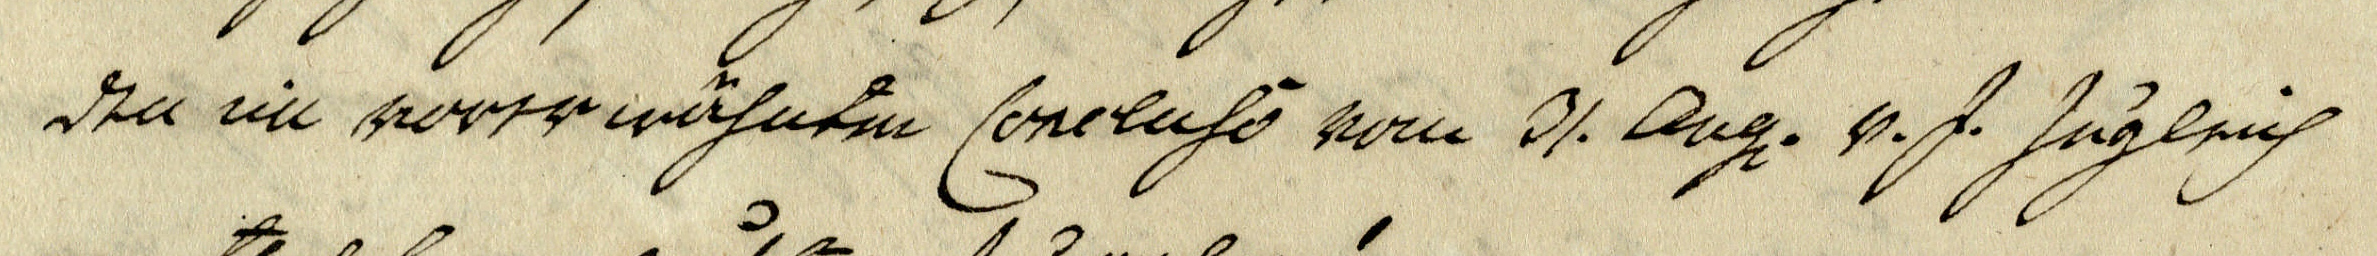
den im vorerwähnten Concluso vom 31. Aug. v. J. zugleich
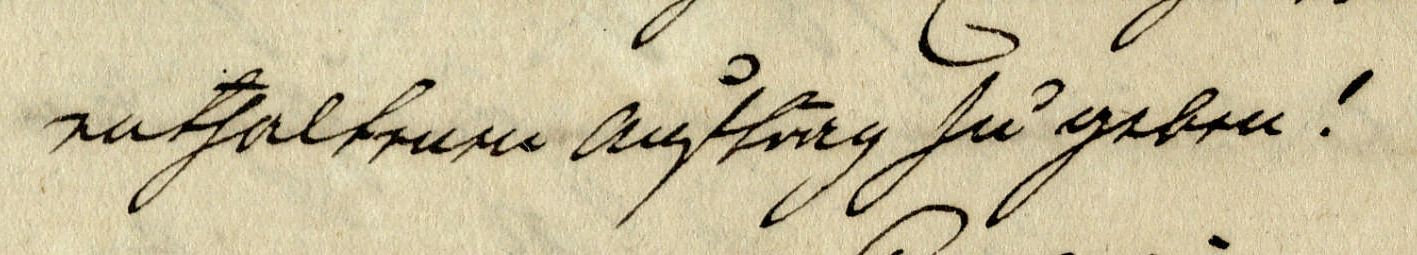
enthaltenen Auftrag zu geben?
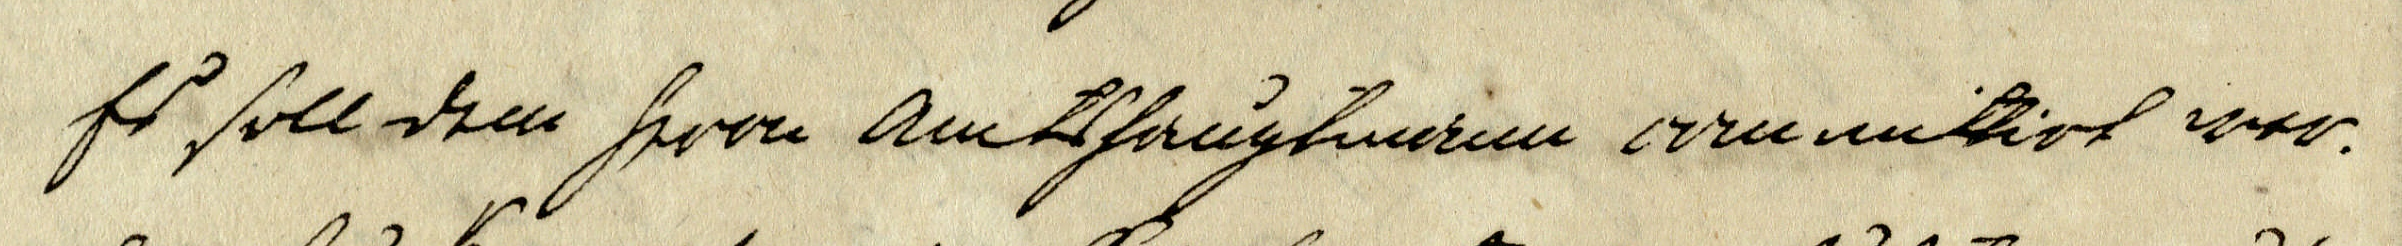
Es soll dem Herrn Amtshauptmann committirt wer¬
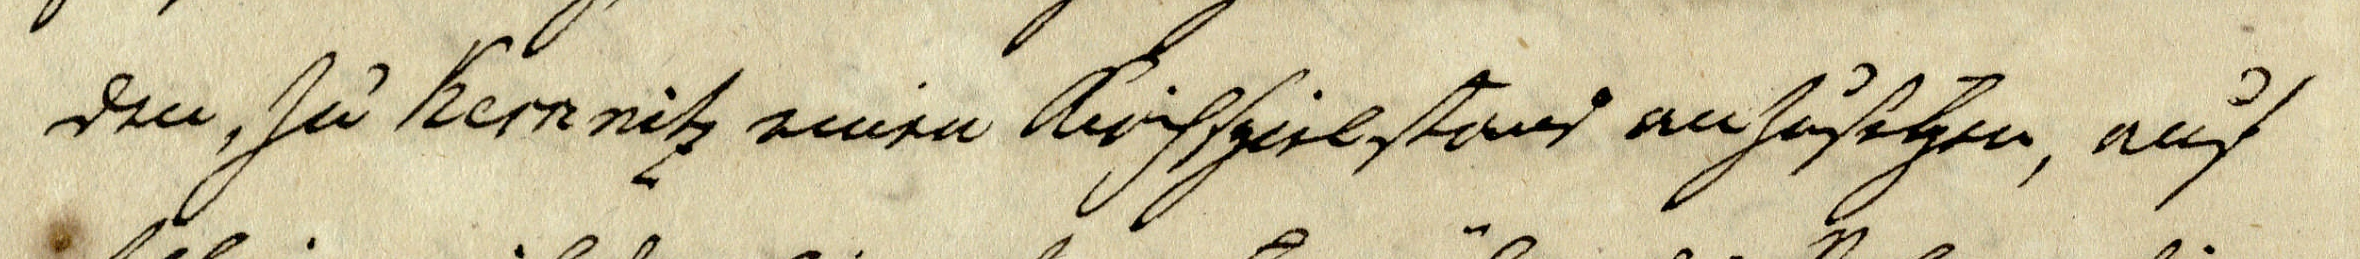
den, zu Kemnitz einen Kirchspielstand anzusetzen, auf
